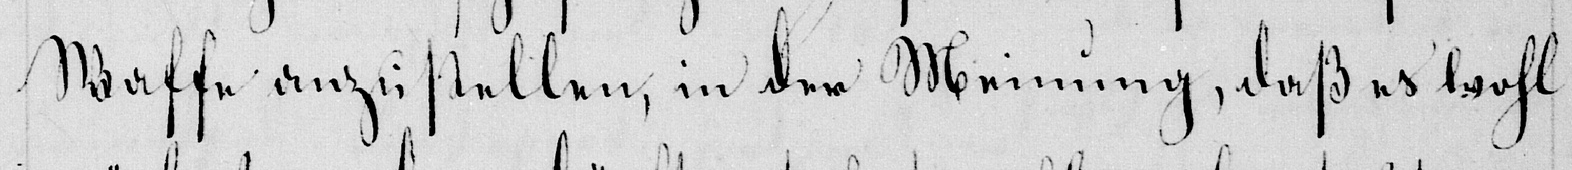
Waffe anzustellen, in der Meinung, daß es wohl
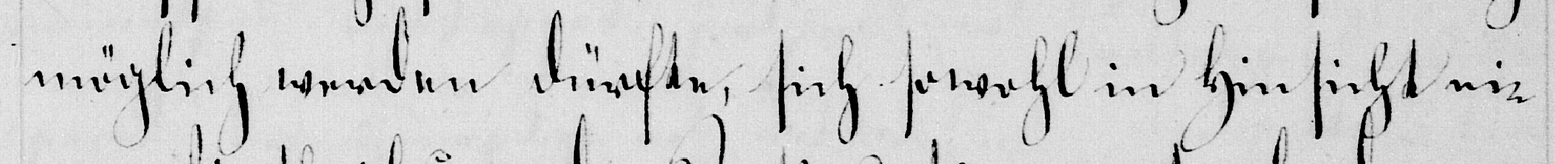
möglich werden dürfte, sich sowohl in Hinsicht ei¬
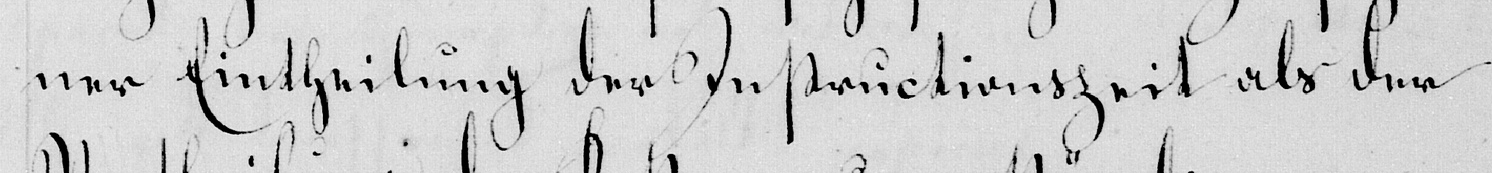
ner Eintheilung der Instructionszeit als der
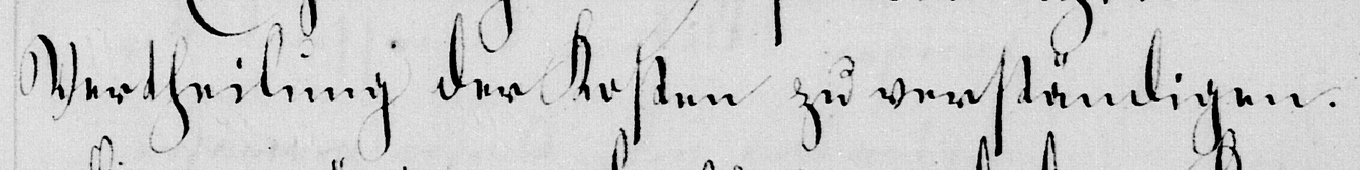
Vertheilung der Kosten zu verständigen.
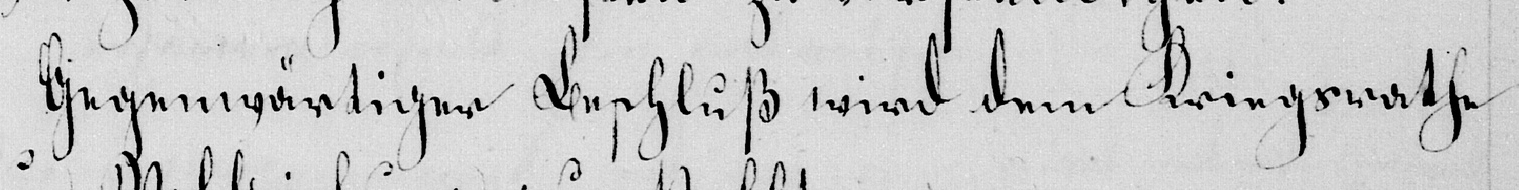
Gegenwärtiger Beschluß wird dem Kriegsrathe
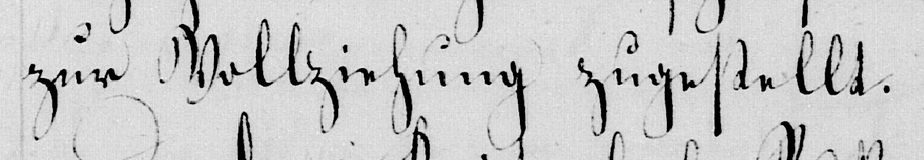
zur Vollziehung zugestellt.
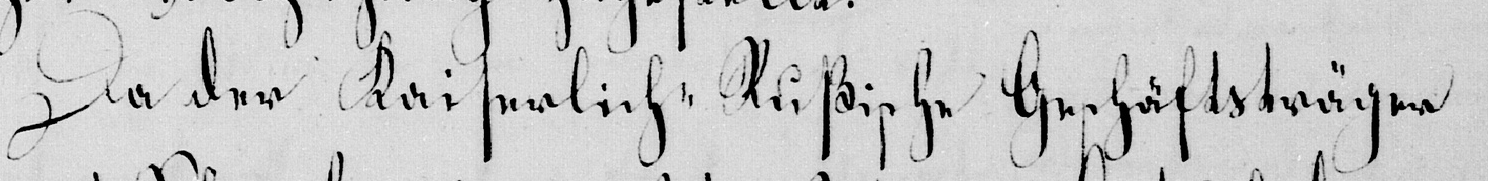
Da der Kaiserlich-Rußische Geschäftsträger
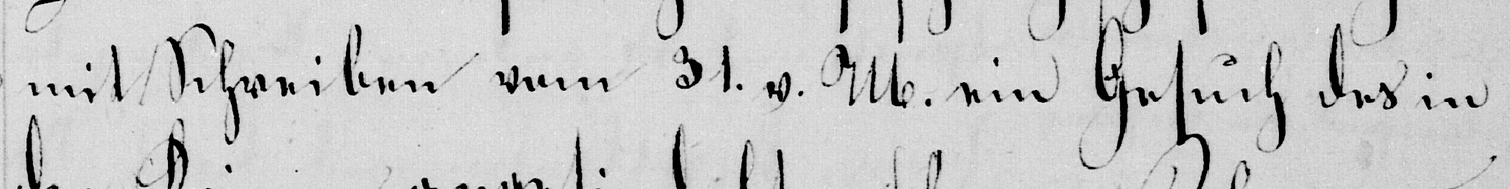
mit Schreiben vom 31. v. M. ein Gesuch des in
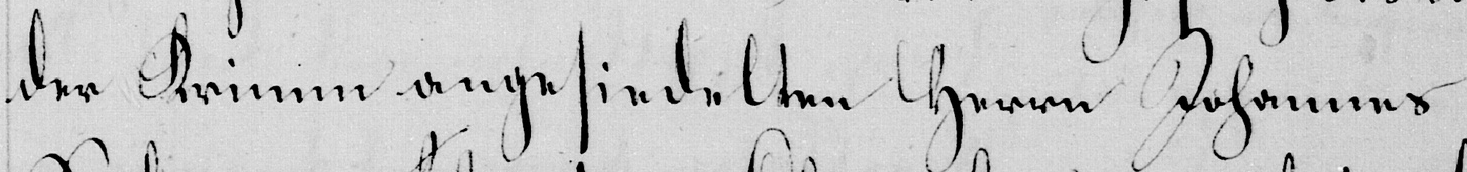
der Krimm angesiedelten Herrn Johannes
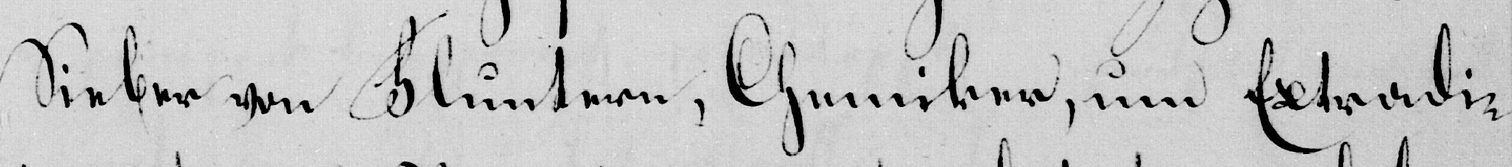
Sieber von Fluntern, Chemiker, um Extradi¬
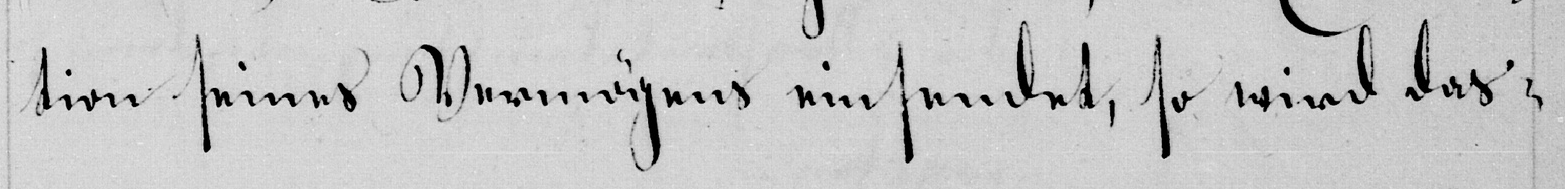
tion seines Vermögens einsendet, so wird das-
